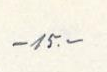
15
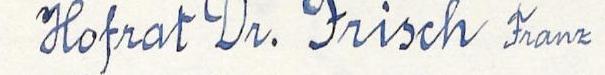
Hofrat Dr. Frisch Franz
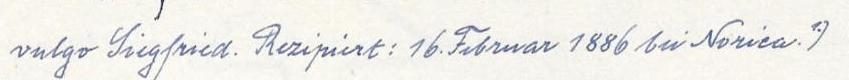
v/o Siegfried. Rezipiert: 16. Februar 1886 bei Norica 1)
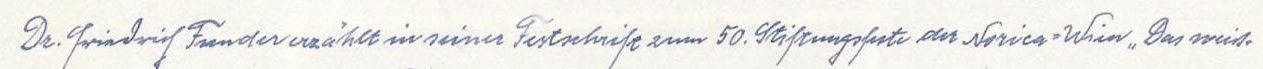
Dr. Friedrich Funder erzählt in seiner Festschrift zum 50. Stiftungsfeste der Norica - Wien „Das weiß-
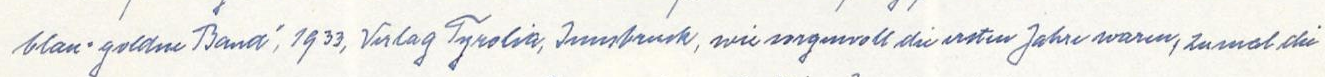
blau - goldene Band“, 1933, Verlag Tyrolia, Innsbruck, wie sorgenvoll die ersten Jahre waren, zumal die
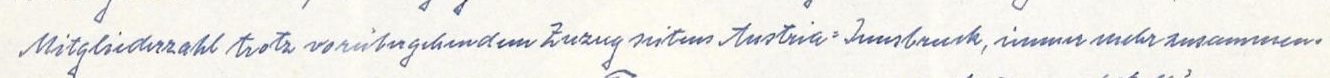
Mitgliederzahl trotz vorübergehendem Zuzug seitens Austria Innsbruck, immer mehr zusammen
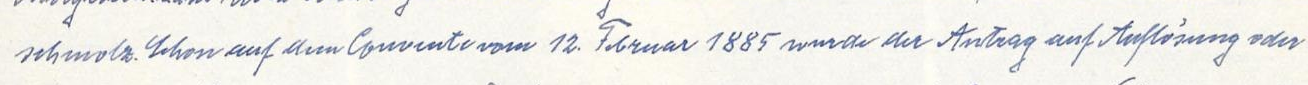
schmolz. Schon auf dem Convent vom 12. Februar 1885 wurde der Antrag auf Auflösung oder
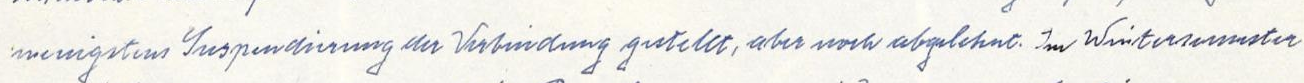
wenigstens Suspendierung der Verbindung gestellt aber noch abgelehnt. Im Wintersemester
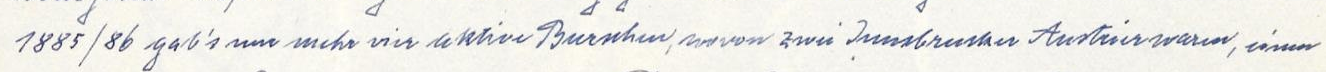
1885/86 gab es nur mehr vier aktive Burschen, wovon zwei Innsbrucker Austria waren, einen
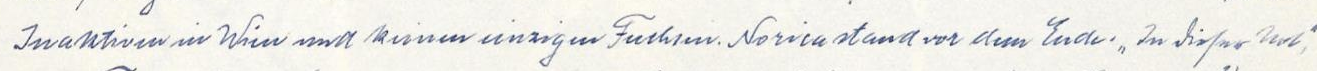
Inaktiven in Wien und keinen einzigen Fuchsen. Norica stand vor dem Ende. „In dieser Not“,
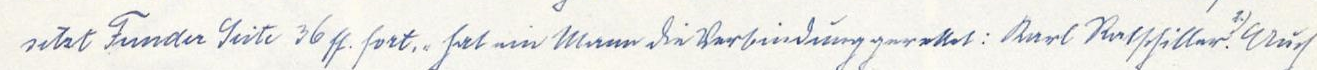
setzt Funder Seite 36 ff. fort, „hat ein Mann die Verbindung gerettet: Karl Ratschiller 2). Auch
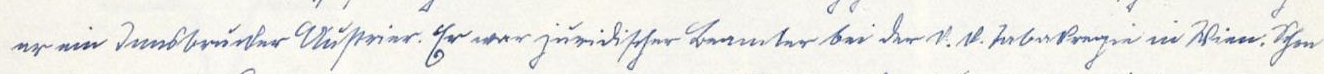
er ein Innsbrucker Austrier. Er war juridischer Beamter bei der Tabakregie in Wien. Schon
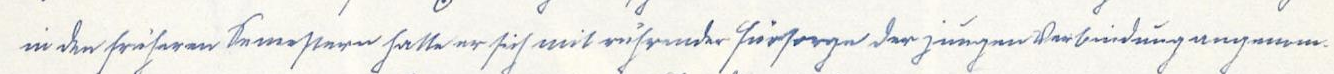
in den früheren Semestern hatte er sich mit rührender Fürsorge der jungen Verbindung angenom-
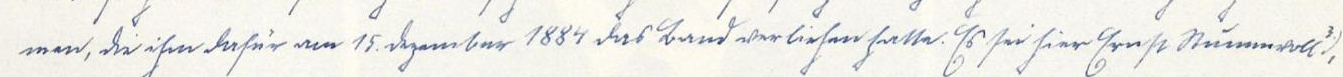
men, die ihn dafür am 15. Dezember 1884 das Band verliehen hatte. Es sei hier Ernst Stummvoll 3)
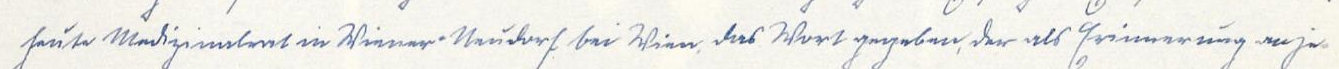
heute Medizalrat in Wiener Neudorf bei Wien das Wort gegeben, der als Erinnerung an je-
